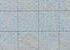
verzinset.
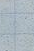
6.
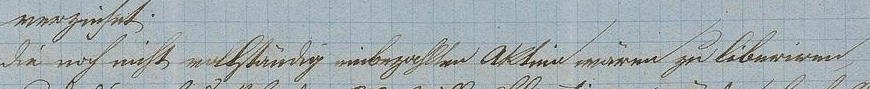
Die noch nicht vollständig einbezahlten Aktien wären zu liberiren
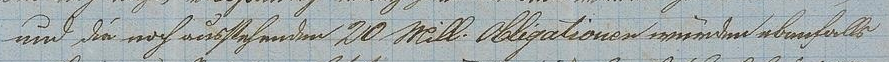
und die noch ausstehenden 20 Mill. Obligationen würden ebenfalls
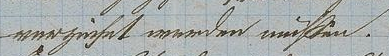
verzinset werden müssen.
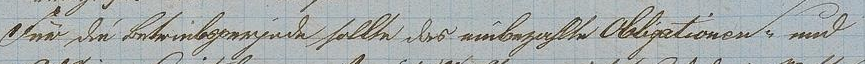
Für die Betriebsperjode sollte das einbezahlte Obligationen- und
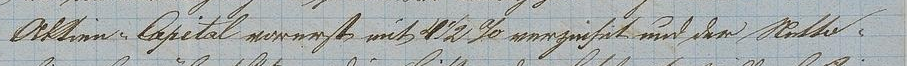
Aktien-Capital vorerst mit 4½% verzinset und der Netto-
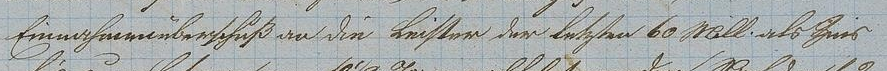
Einnahmenüberschuß an die Leister der letzten 60 Mill. als Zins
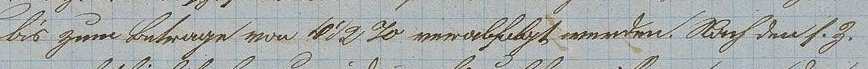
bis zum Betrage von 4½% verabfolgt werden. Nach der s. Z.
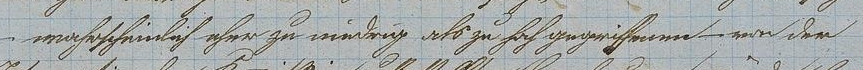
– wahrscheinlich eher zu niedrig als zu hoch gegriffenen – von der
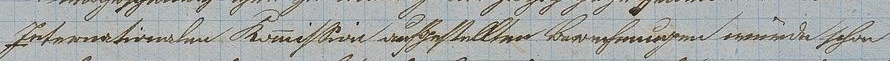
Internationalen Kommission aufgestellten Berechnungen würde schon
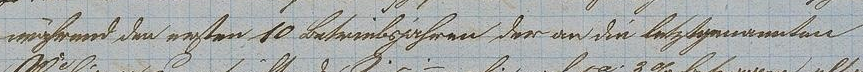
während den ersten 10 Betriebsjahren der an die letztgenannten
